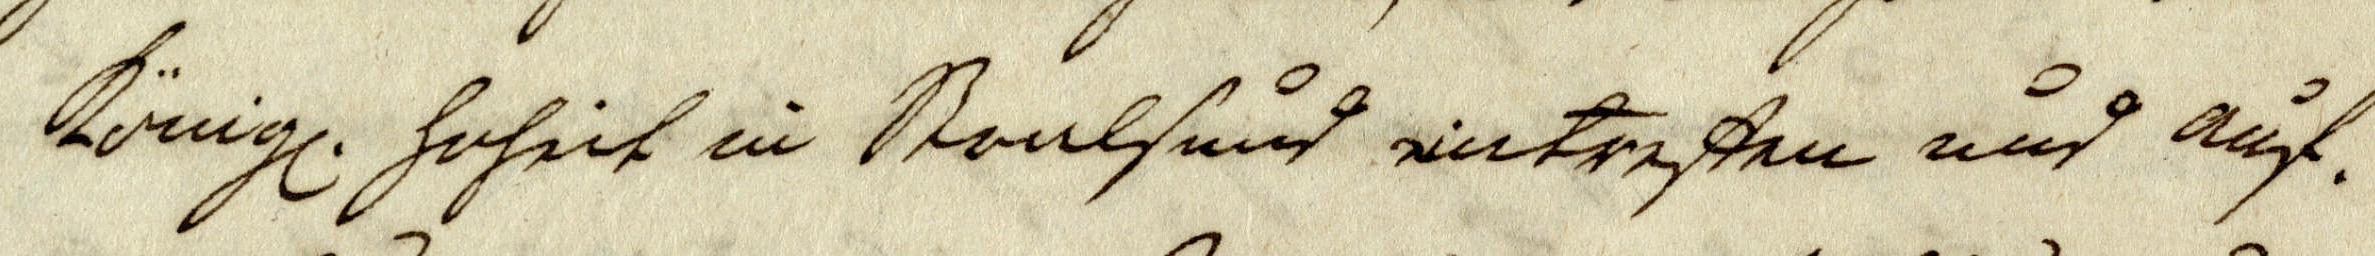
Königl. Hoheit in Stralsund eintreffen und Auf¬
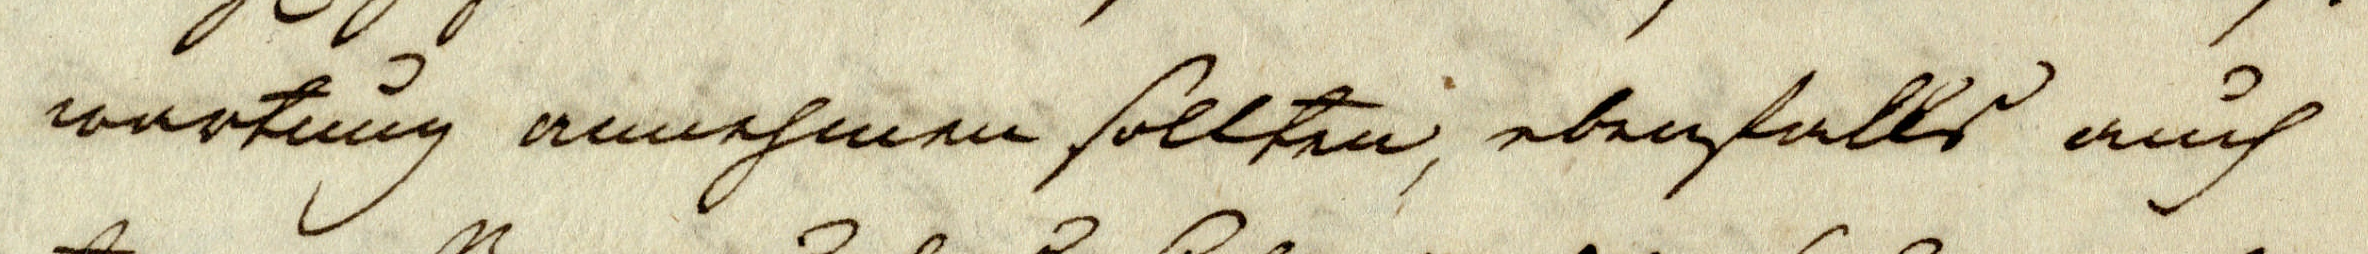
wartung annehmen sollten, ebenfalls auch
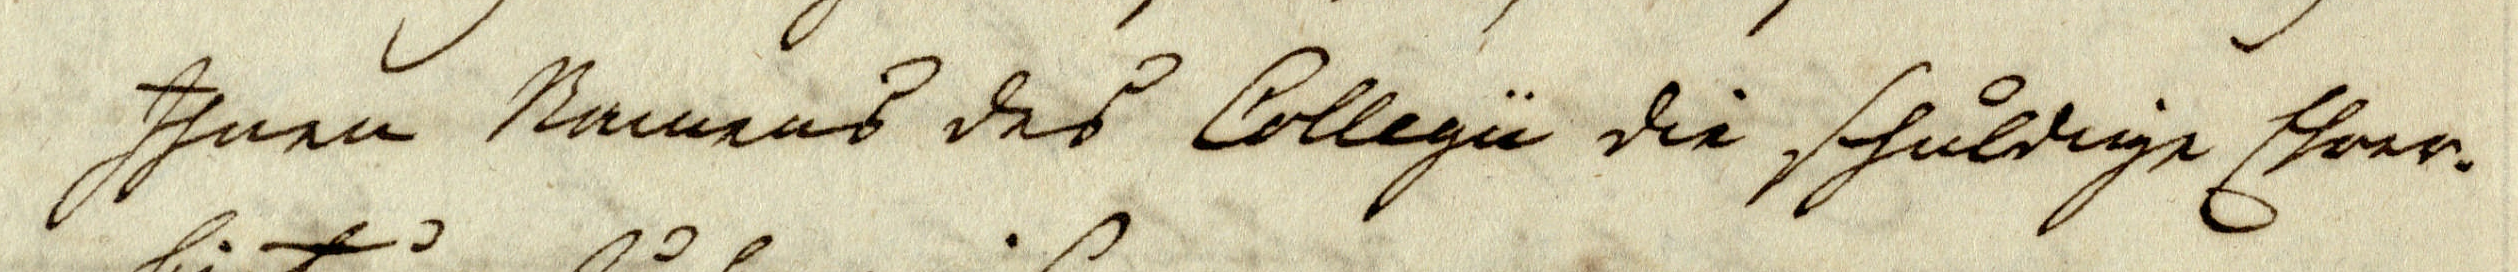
Ihnen Namens des Collegii die schuldige Ehrer¬
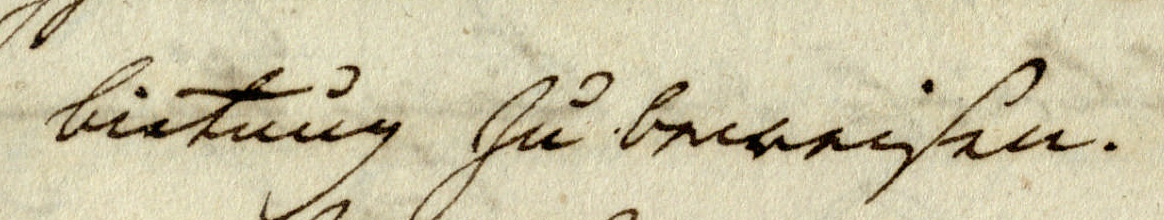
bietung zu beweisen.
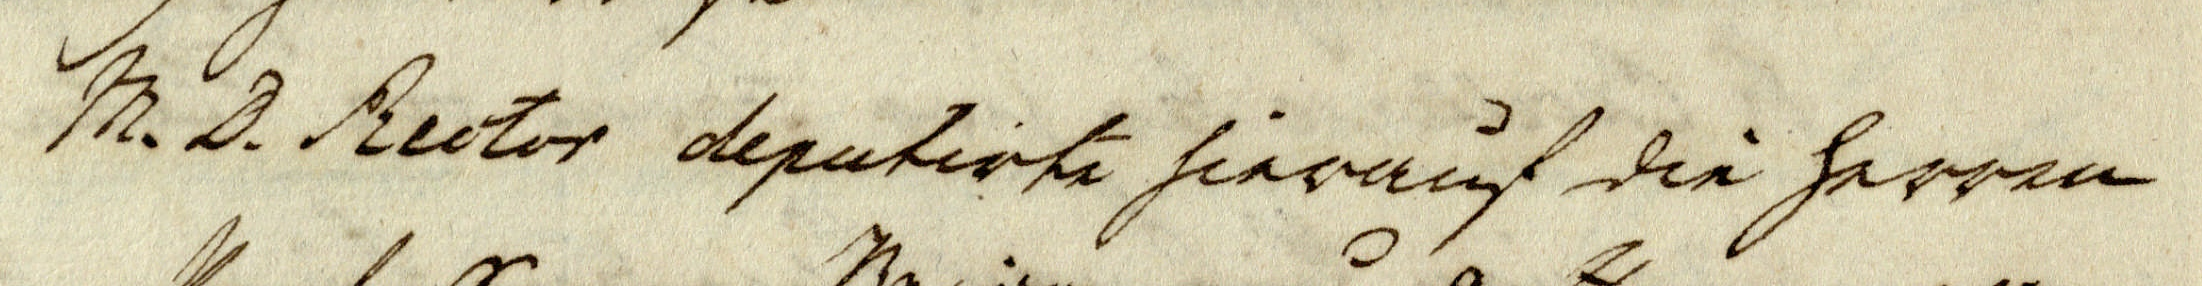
M. D. Rector deputirte hierauf die Herren
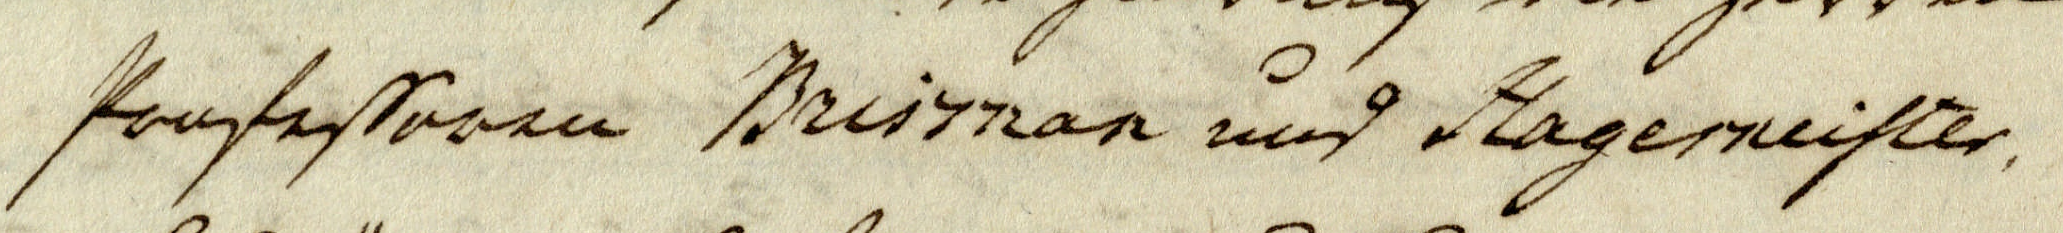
Professoren Brisman und Hagemeister,
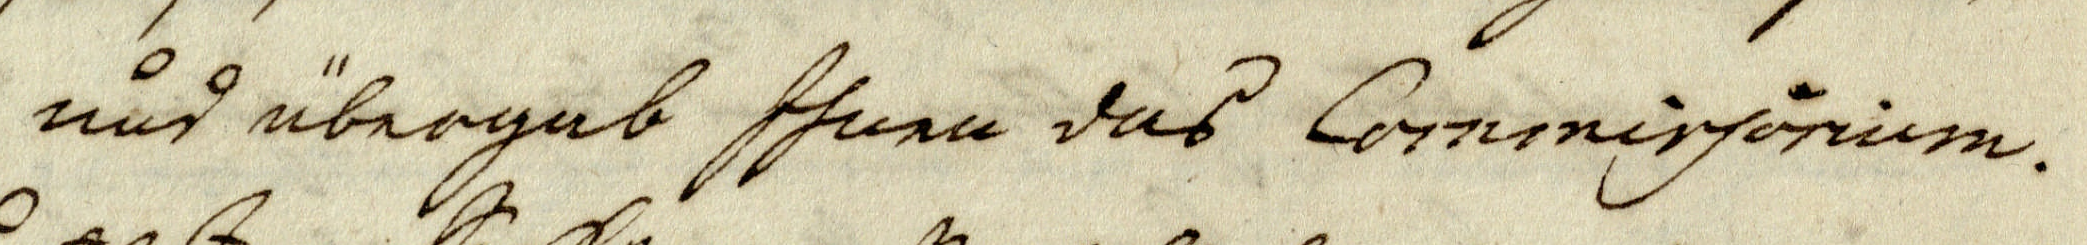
und übergab Ihnen das Commissorium.
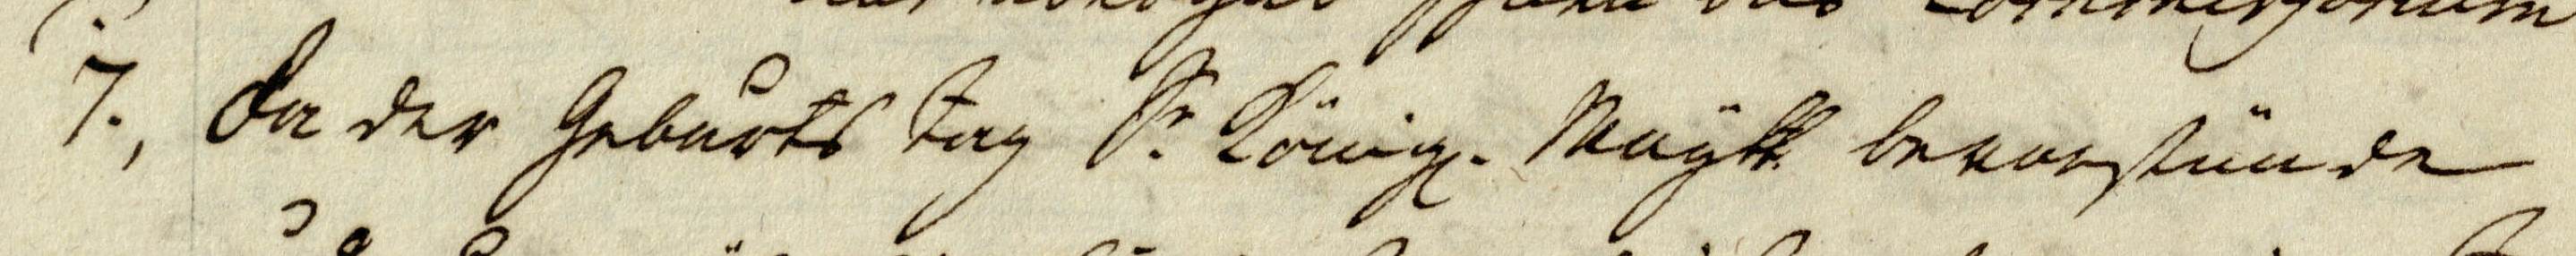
7., Da der Geburts Tag Sr Königl. Maÿtt. bevorstünde
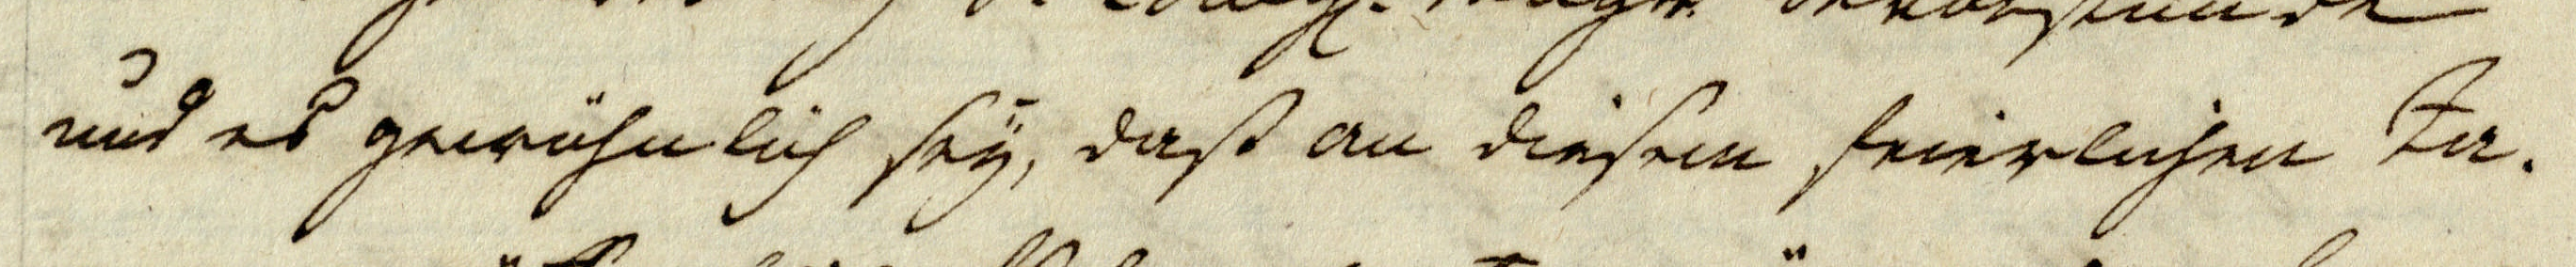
und es gewöhnlich seÿ, daß an diesem feierlichen Ta¬
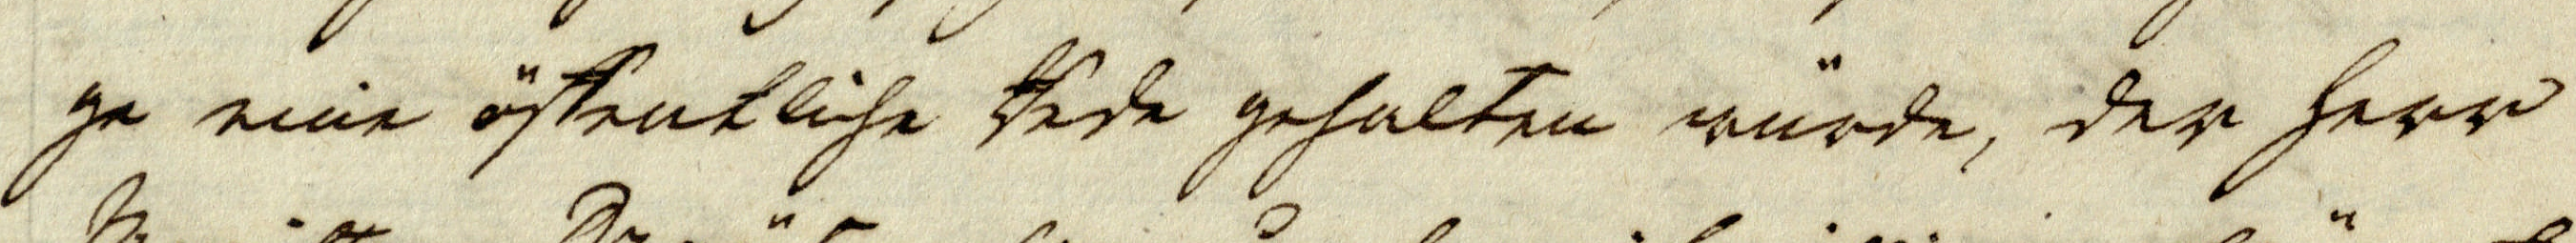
ge eine öffentliche Rede gehalten würde, der Herr
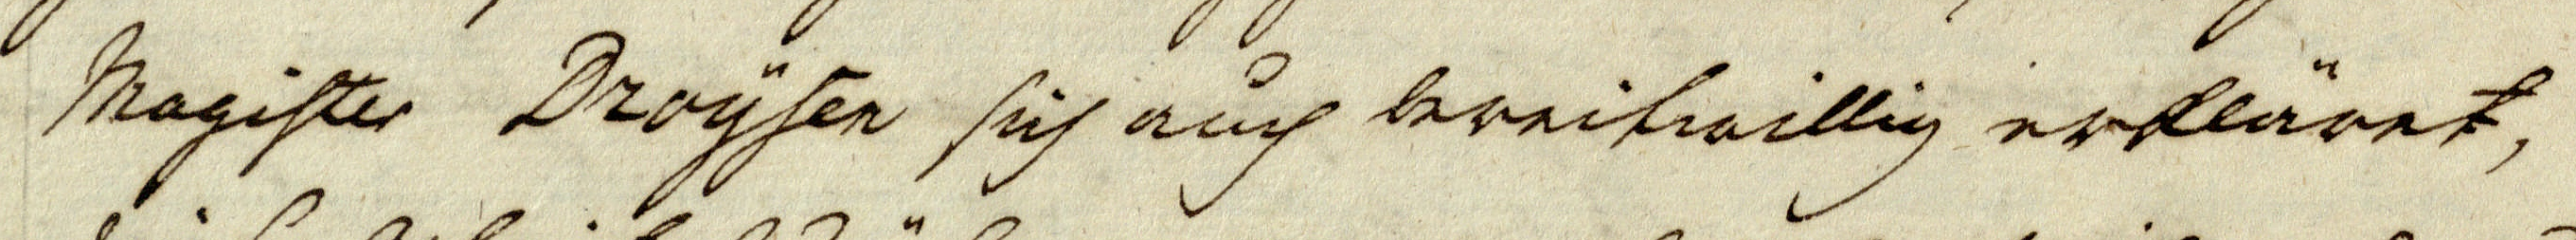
Magister Droÿsen sich auch bereitwillig erkläret,
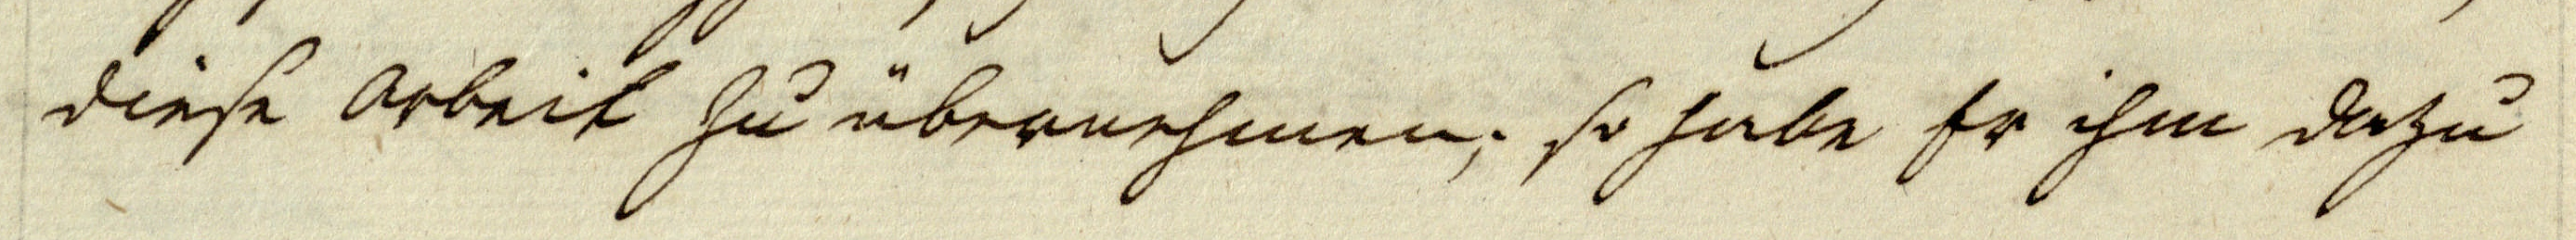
diese Arbeit zu übernehmen; so habe Er ihm dazu
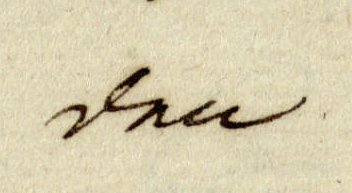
den
